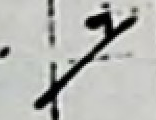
7
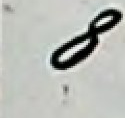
8
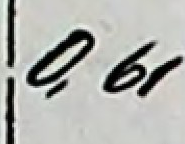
0.61
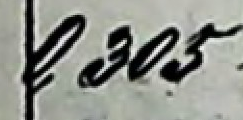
0,308
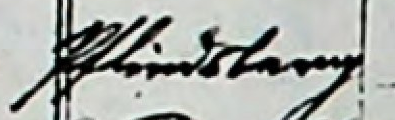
Pflindsberg
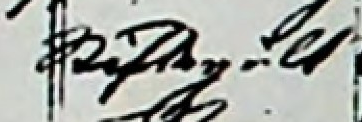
Stiftsgült
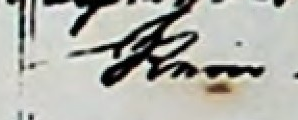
Rein
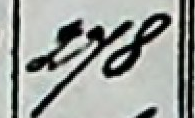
278
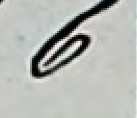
6
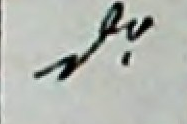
do
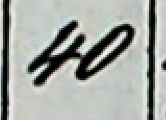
40
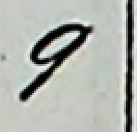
9
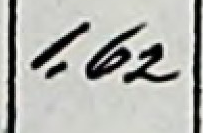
1,62
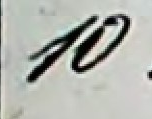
10
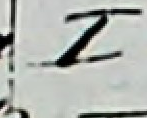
I
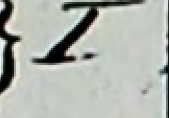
I
